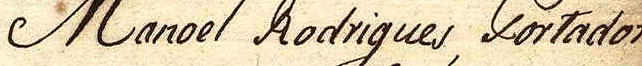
Manoel Rodrigues, Portador
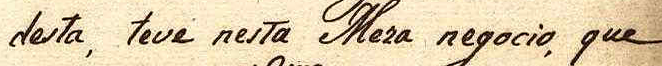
desta, teve nesta Meza negocio, que
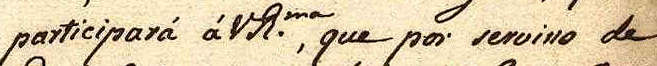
participará á V R.ma, que por servisso de
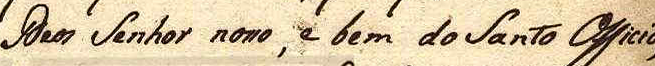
Deos Senhor nosso, e bem do Santo Officio,
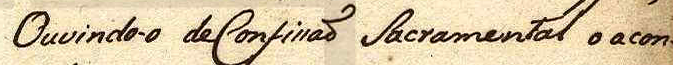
Ouvindo-o de Confissaõ Sacramental o acon
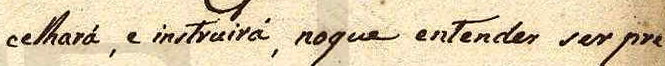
celhará, e instruirá, no que entender ser pre
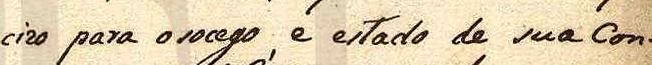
cizo para o socego, e estado de sua con
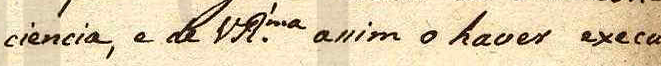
ciencia, e de V R.ma assim o haver execu
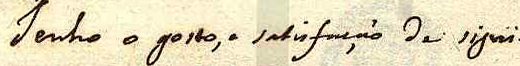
Tenho o gosto, e satisfaçaõ de signi
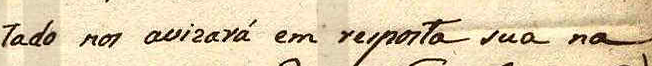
Tado nos avizará em resposta sua na
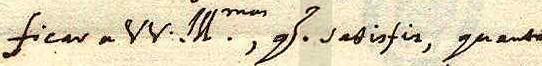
ficar a VV. Ill.mas, q̄ satisfiz, quanto
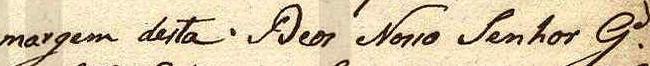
margem desta. Deos Nosso Senhor G.de
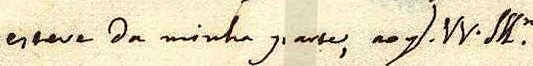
esteve da minha parte, ao q̄ VV. Ill.mas
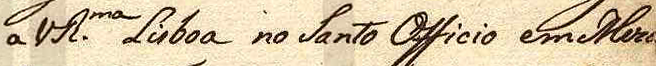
a VR.ma Lisboa no Santo Officio em Meza
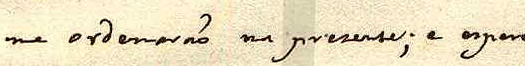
me ordenaraõ na prezente; e espero,
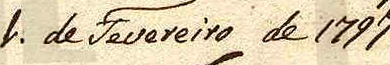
1. de Fevereiro de 1797
